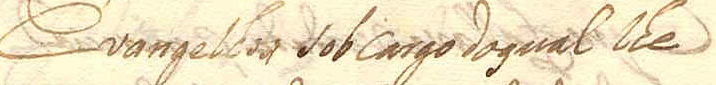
Evangelhos sob cargo do qual lhe
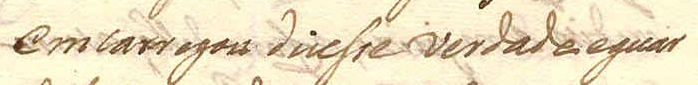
emcarregou dicesse verdade e guar
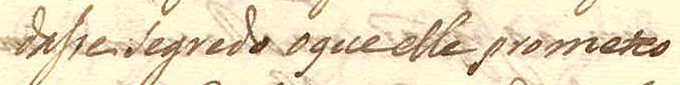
dasse segredo o que elle prometeo
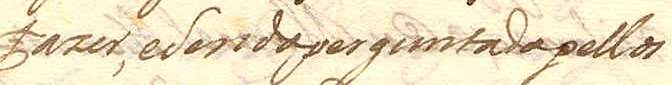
fazer, e sendo perguntada pellos
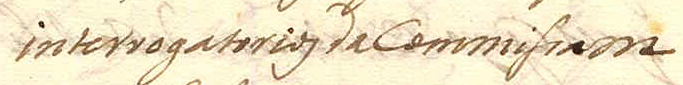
interrogatorios da Commissam.
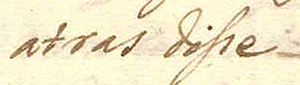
atras disse
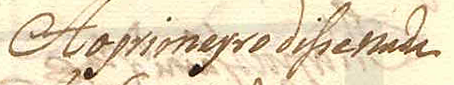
Ao primeyro disse nada
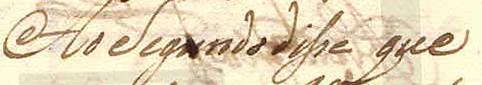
Ao Segundo disse que
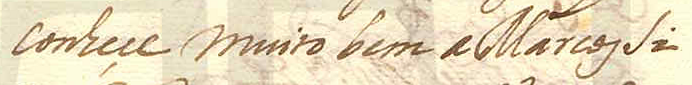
conhece muito bem a Marcos si
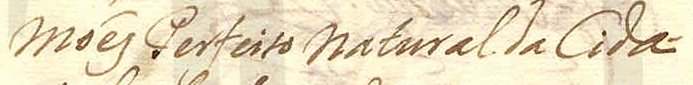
moẽs Perfeito natural da Cida
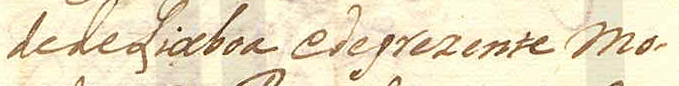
de de Lixboa e de prezente mo
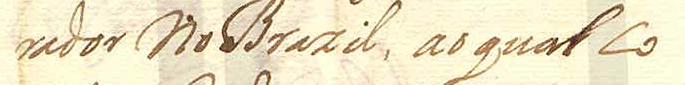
rador no Brazil, ao qual co
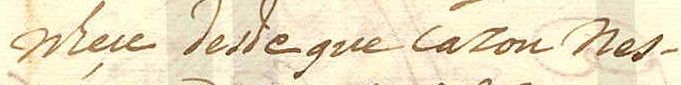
nhece desde que cazou nes
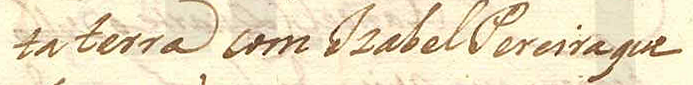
ta terra com Izabel Pereira que
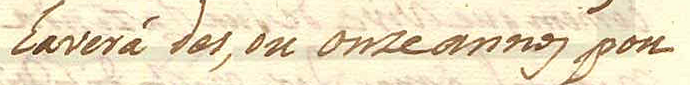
haverá des, ou onze annos pou
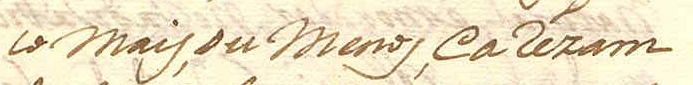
co mais, ou menos, e a Rezam
